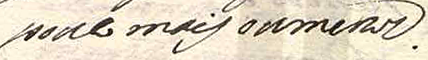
pouco mais ou menoz.
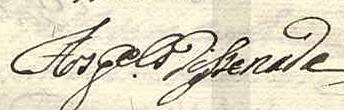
Aos g.es disse nada
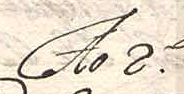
Ao 2.o
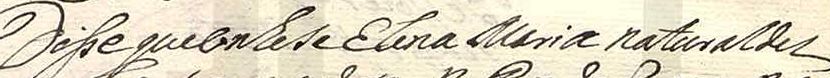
Disse que conhese Elena Maria natural dez
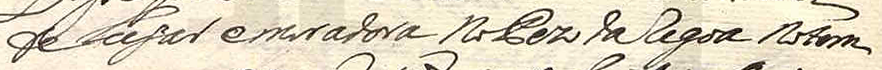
te Lugar e moradora no Pezo da Regoa no tem
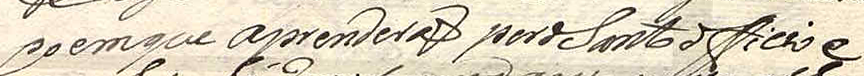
po em que a prenderaõ por o Santo officio e
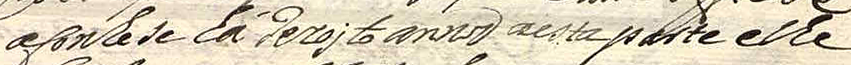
a Conhese há dezojto annos a esta parte e lhe
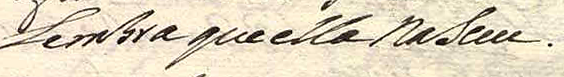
Lembra que ella nasceu.
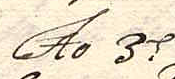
Ao 3.o
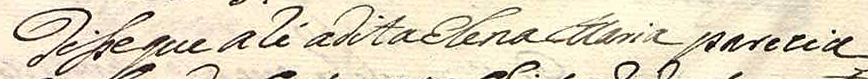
Disse que a Ré a dita Elena Maria parecia
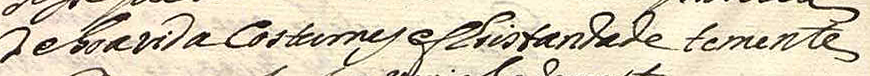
de boa vida costumes e Christandade temente
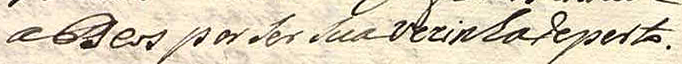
a Deos por ser sua vezinha de perto.
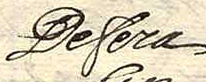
Defeza.
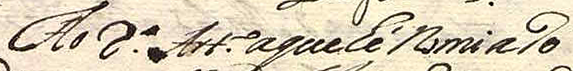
Ao 2.o Art.o a que hé nomiado
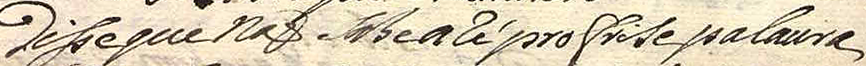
disse que naõ sabe a Ré profrise palaura
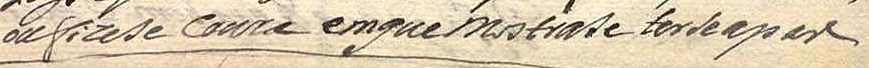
ou fizese couza em que mostrase ter se apar
